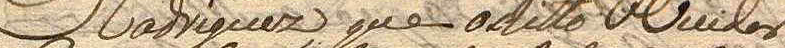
Rodriguez, que o ditto OVuidor
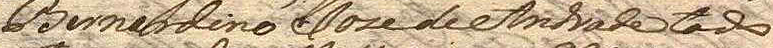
Bernardino Ioze de Andrade todo
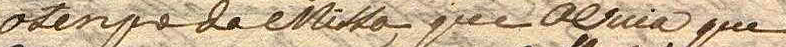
o tenpo da Missa, que ovuia, que
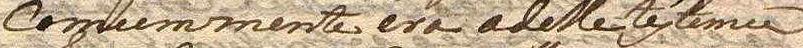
Comummente era a delle testemu
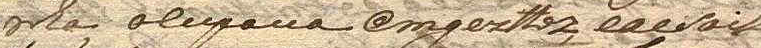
nha ocupava em gezttoz e acsoiz
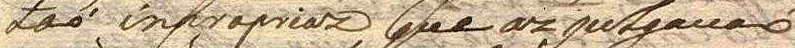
taõ inpropriaz, que az julgauaõ
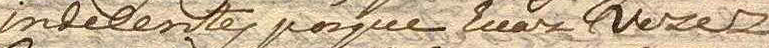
indecentes porque huaz vezez
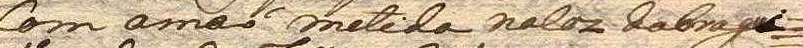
Com a maõ metida na coz da bragui
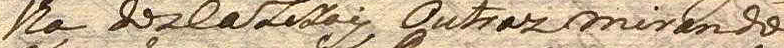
lha, doz Calssois, Outraz mirando
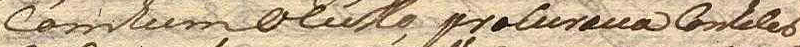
Com hum ocullo, procuraua conhecer
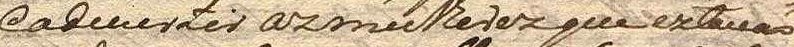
e adeuertir az mulherez que eztauaõ
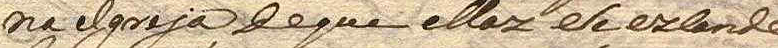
na Igreja, De que ellaz se escande
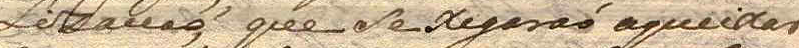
lizauaõ, que se xegaraõ a queixar
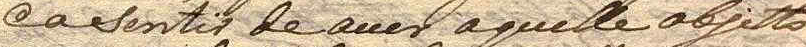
e a Sentir de auer aquelle objetto
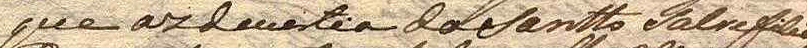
que az deuertia do Santto sacreficio,
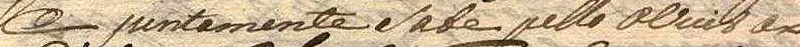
e juntamente sabe pello ovuir ao
